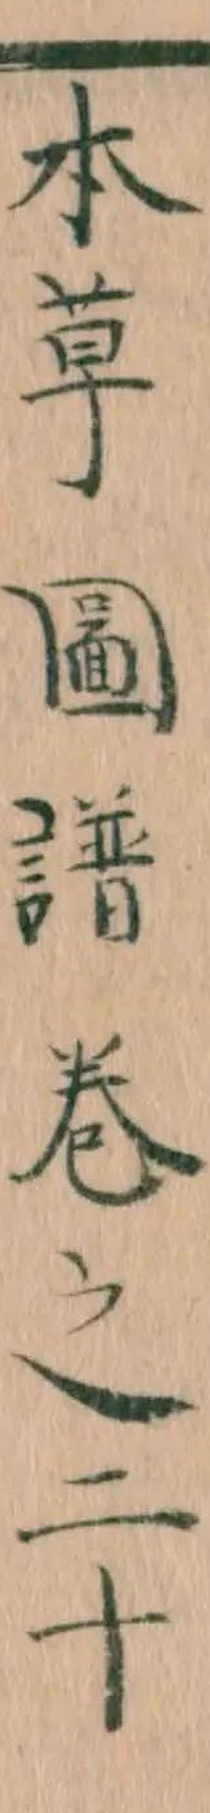本草図譜巻之二十
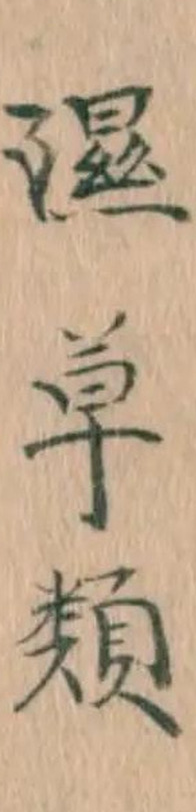隰草類
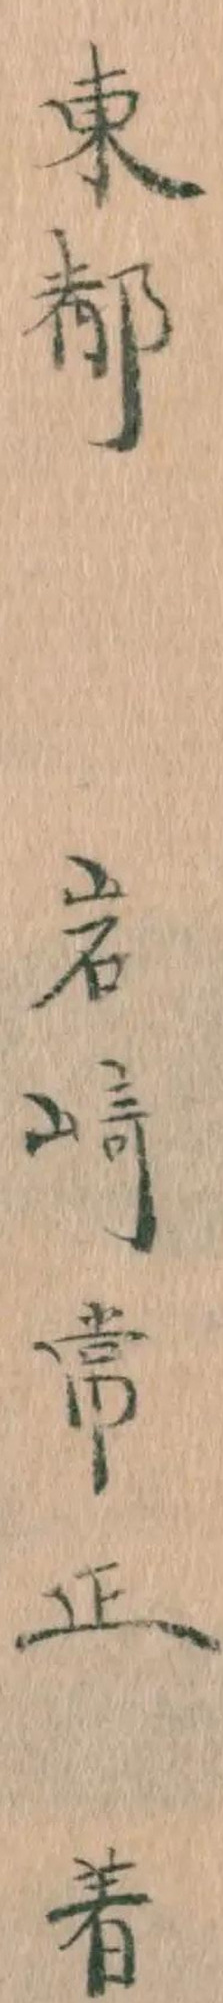東都岩崎常正著

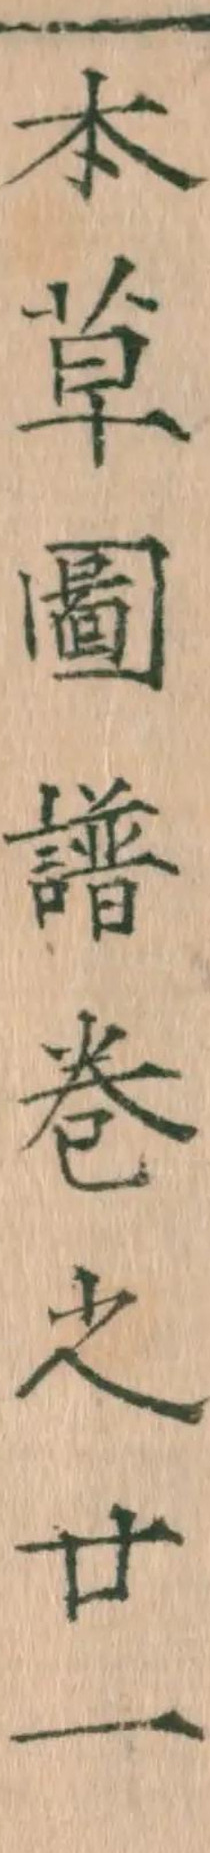本草図譜巻之廿一
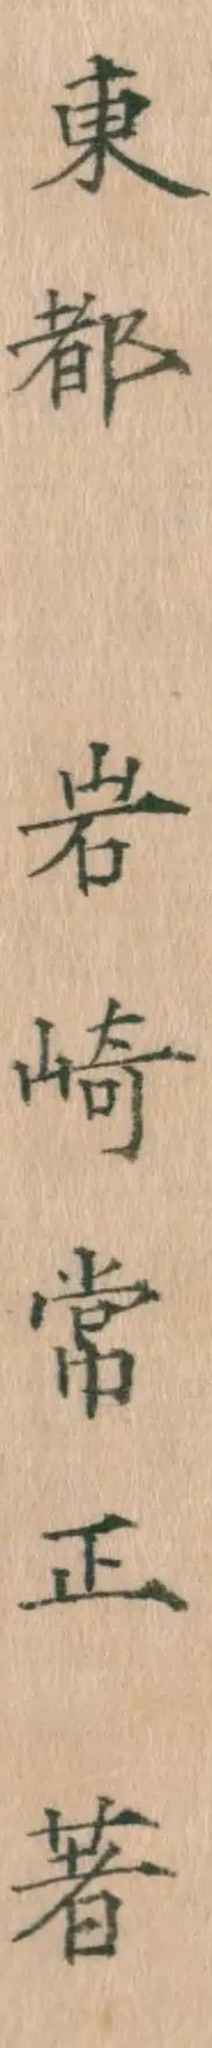東都岩崎常正著
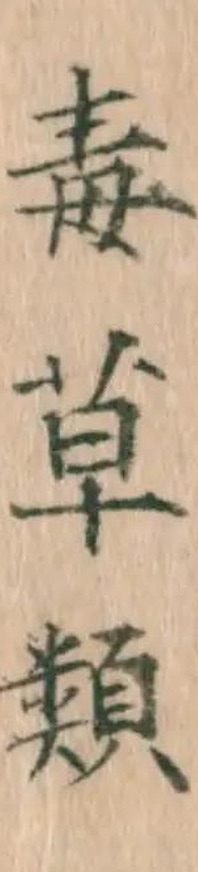毒草類

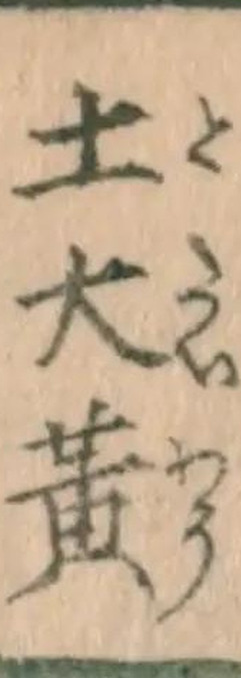土大黄

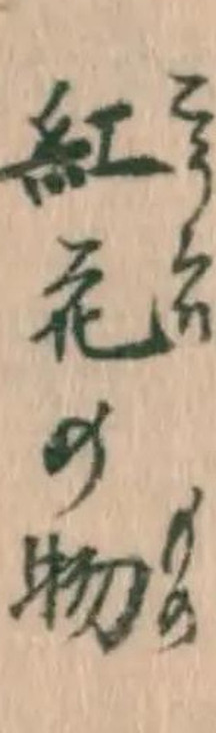紅花の物

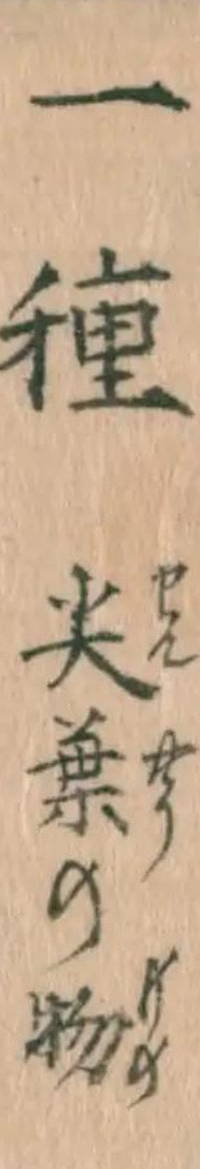一種尖葉の物

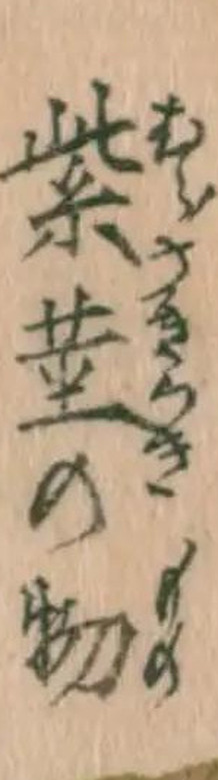紫茎の物
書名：本草図譜. 巻19-21
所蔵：国立国会図書館 National Diet Library, JAPAN
